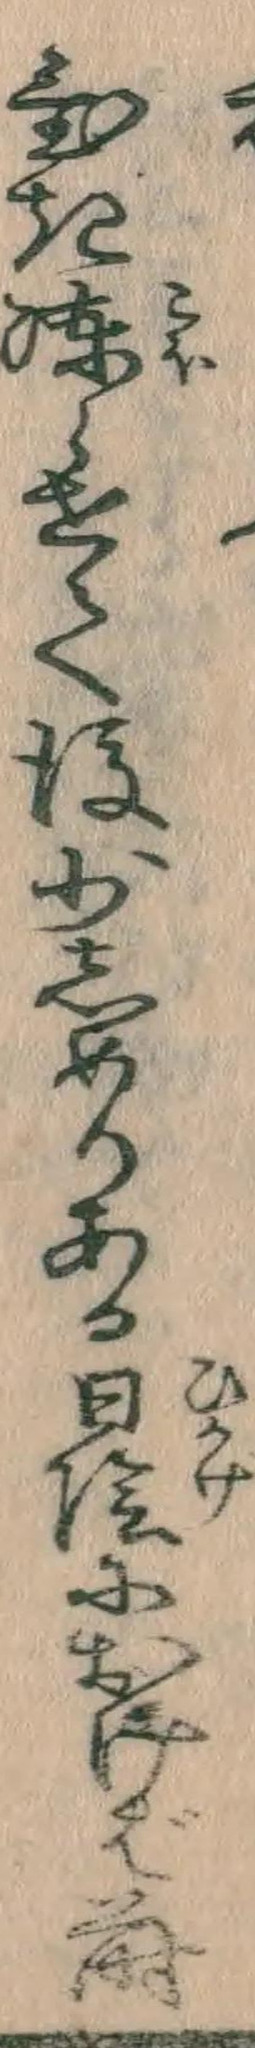置き凍らせて後少しめりある日陰におけば蒔
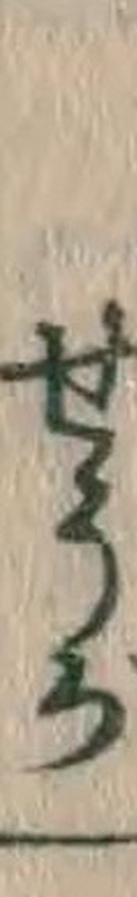せうが
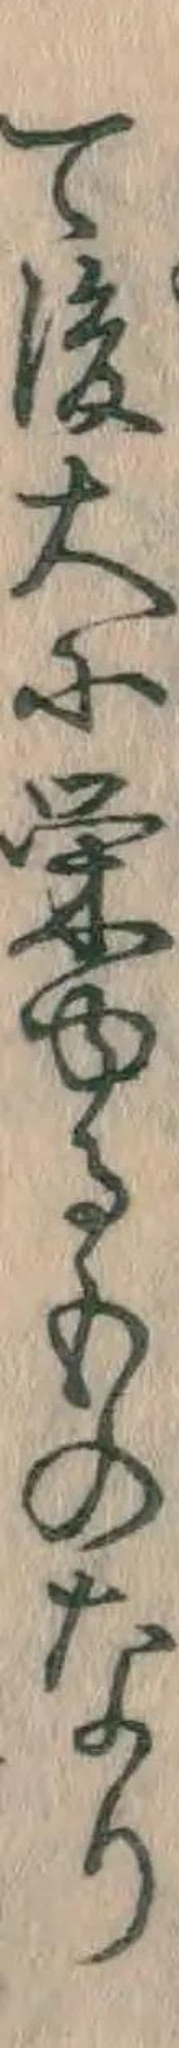て後大に栄ゆるものなり
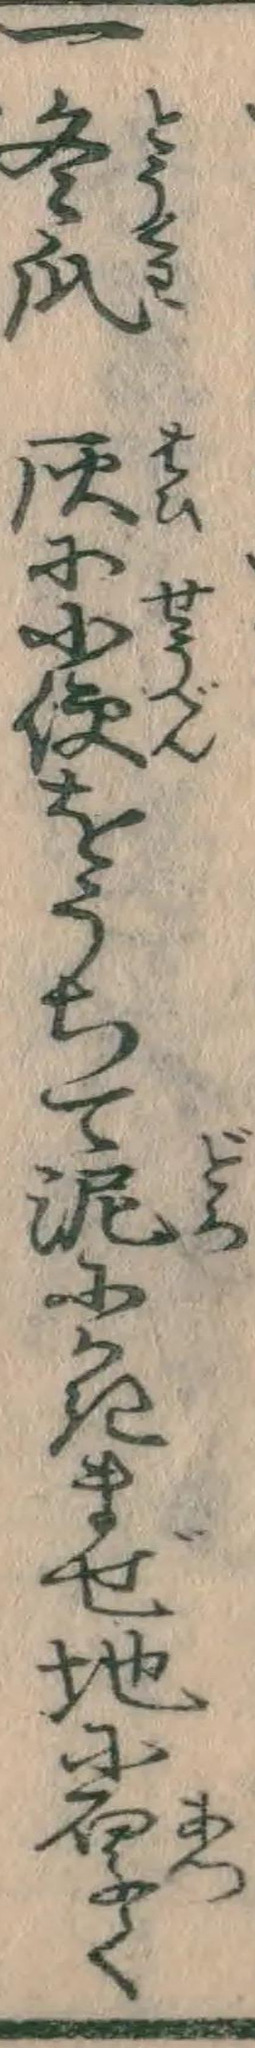一冬瓜灰に小便をうちて泥にかきまぜ地に厚く
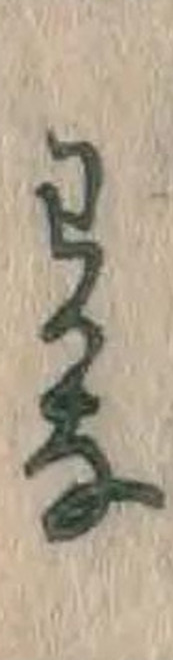わかな
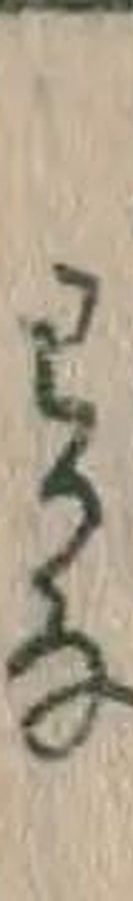わかな
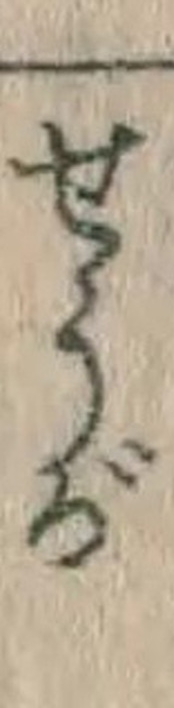せうが
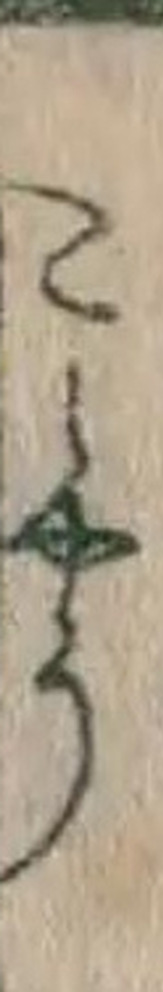こしやう
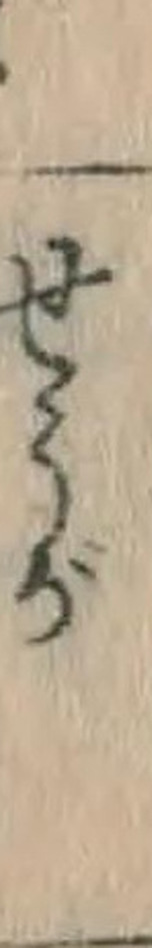せうが
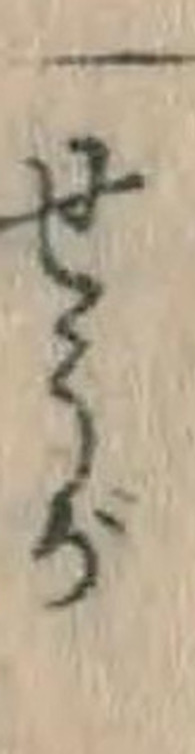せうが
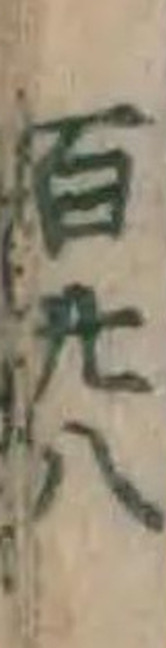百廿八

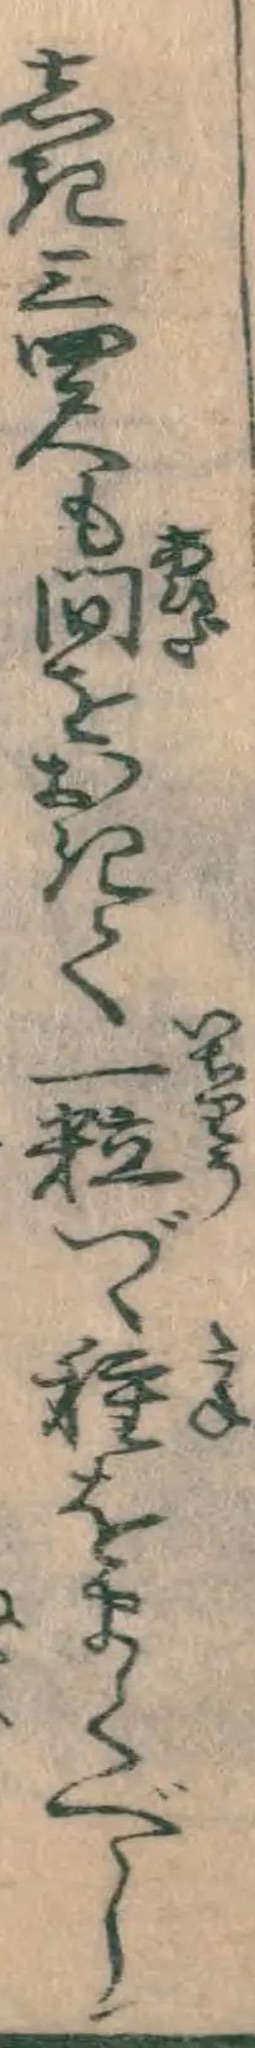しき三四尺も間をおきて一粒づゝ種をまくべし
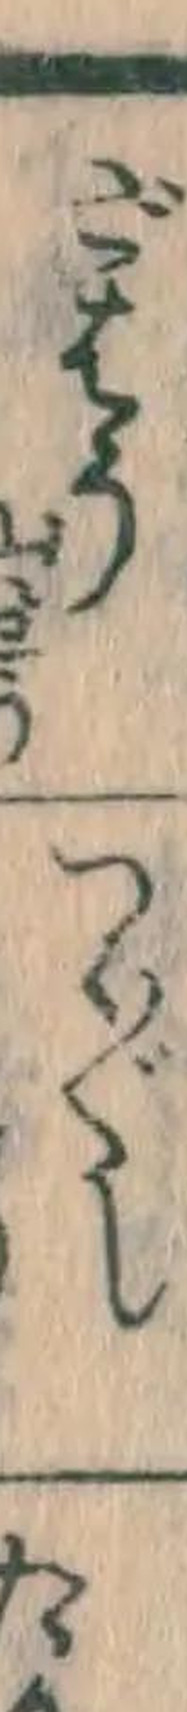ごはうつく〴〵し
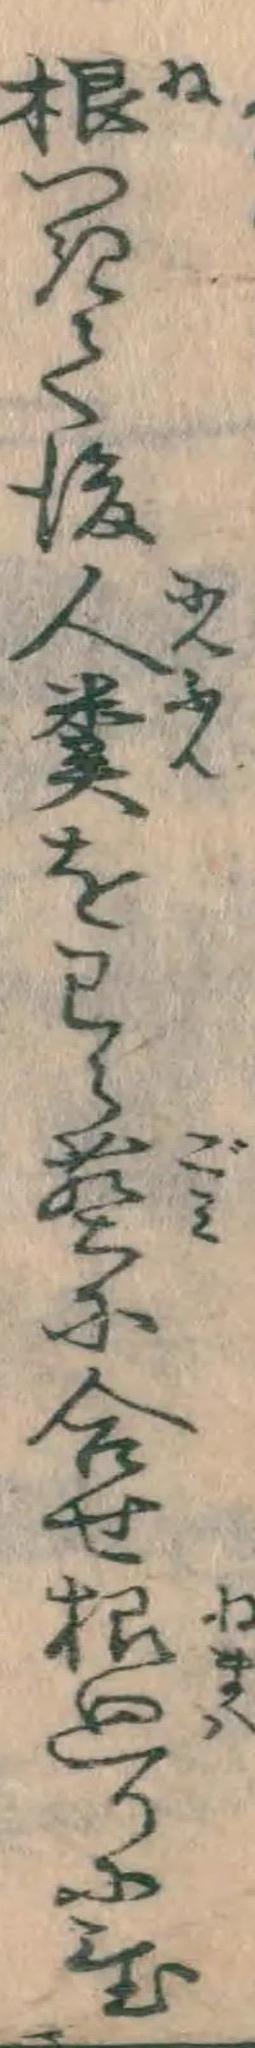根つきて後人糞をわら塵に合せ根廻りに置
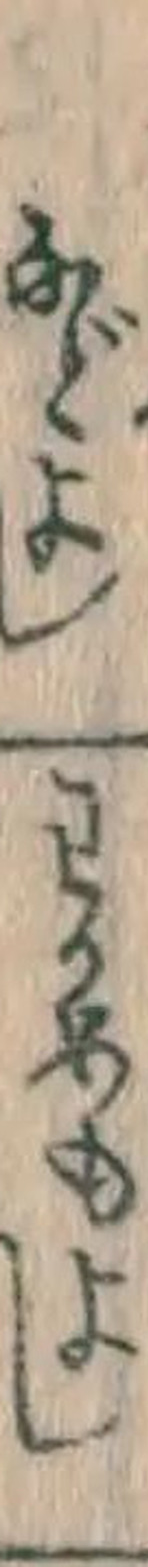などよしわかめもよし
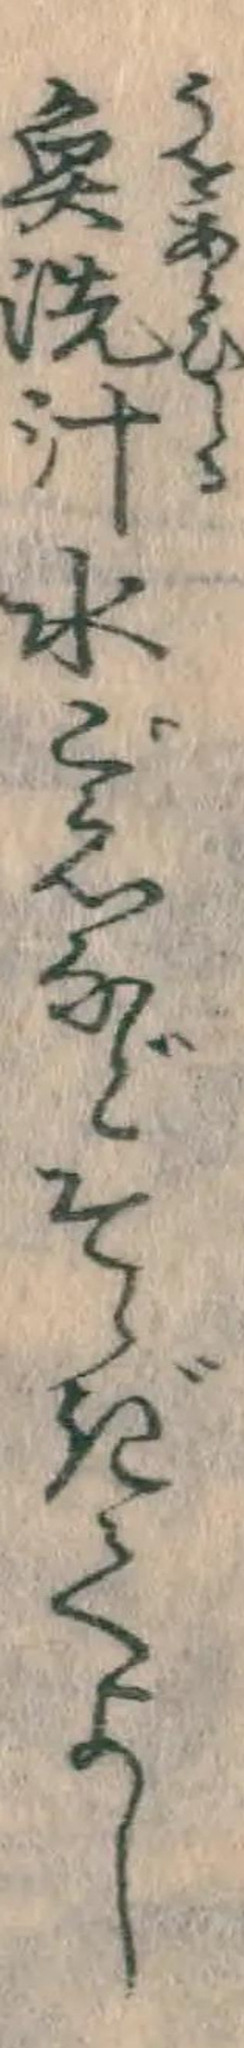魚洗汁水ごえなどそゝぎてよし
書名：広益秘事大全 3巻. [5]
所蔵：国立国会図書館 National Diet Library, JAPAN
